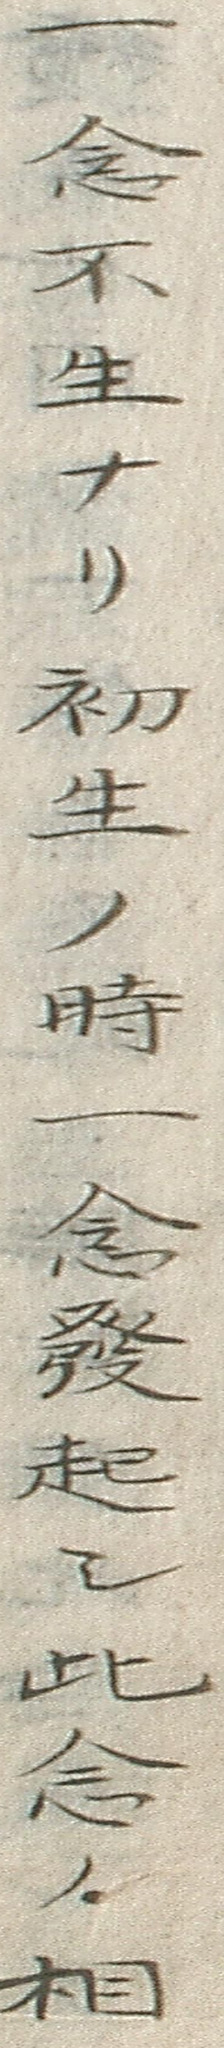一念不生ナリ初生ノ時一念発起シ此念ノ相

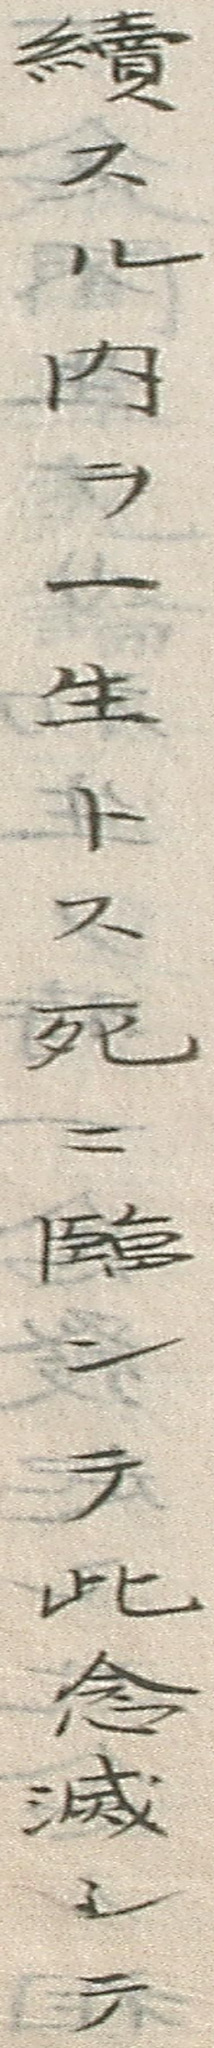続スル内ヲ一生トス死ニ臨ンテ此念滅シテ
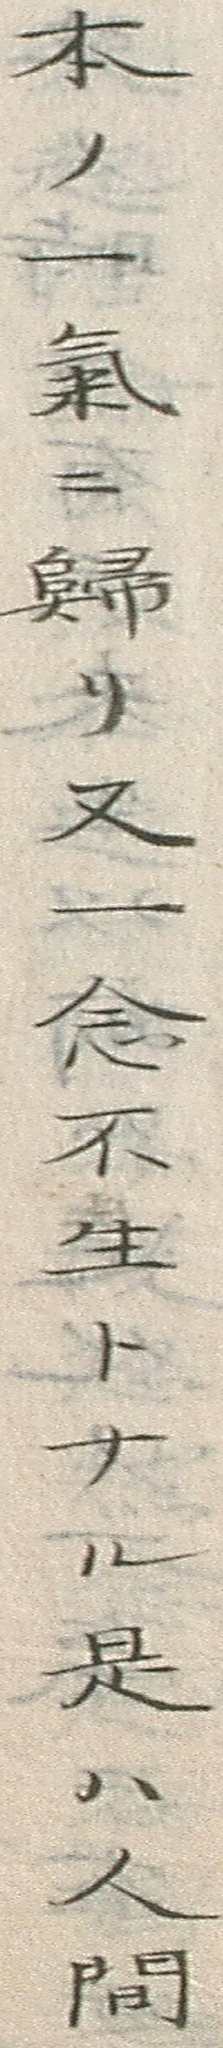本ノ一気ニ帰リ又一念不生トナル是ハ人間
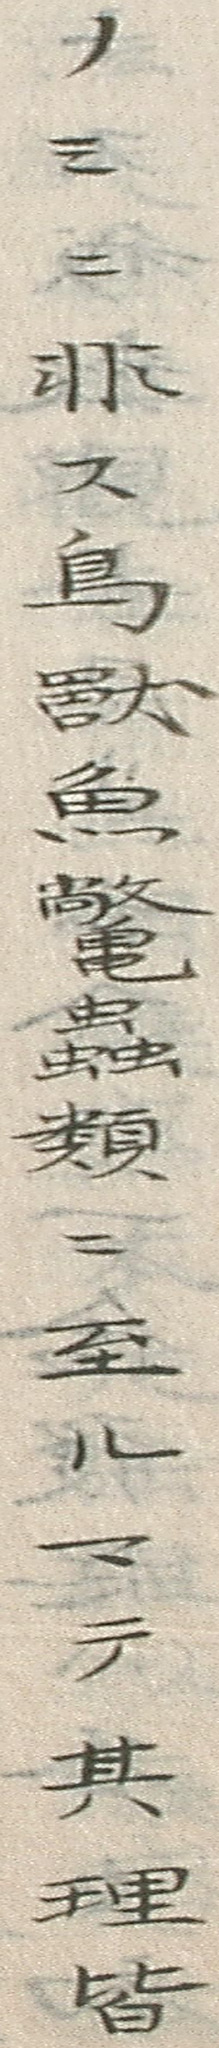ノミニ非ス鳥獣魚鼈蟲類ニ至ルマテ其理皆
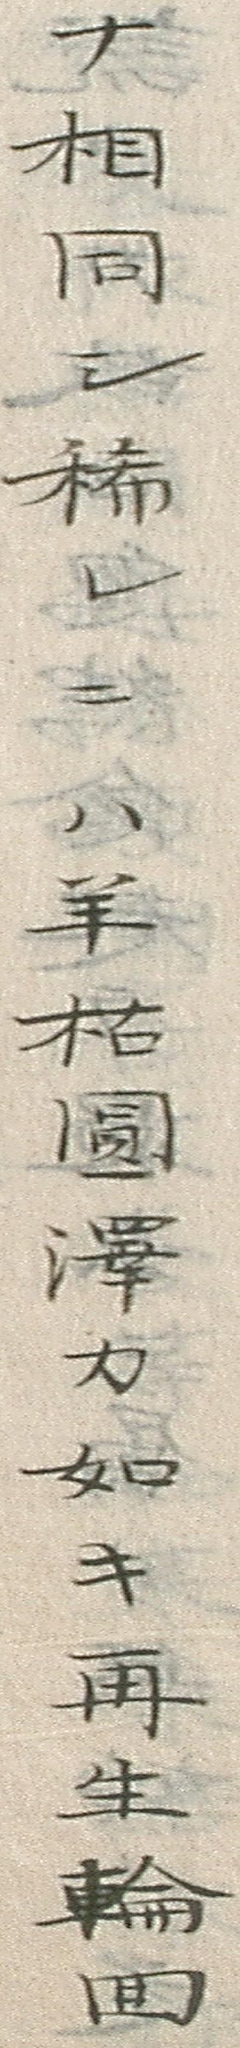ナ相同シ稀レニハ羊枯円沢カ如キ再生輪回
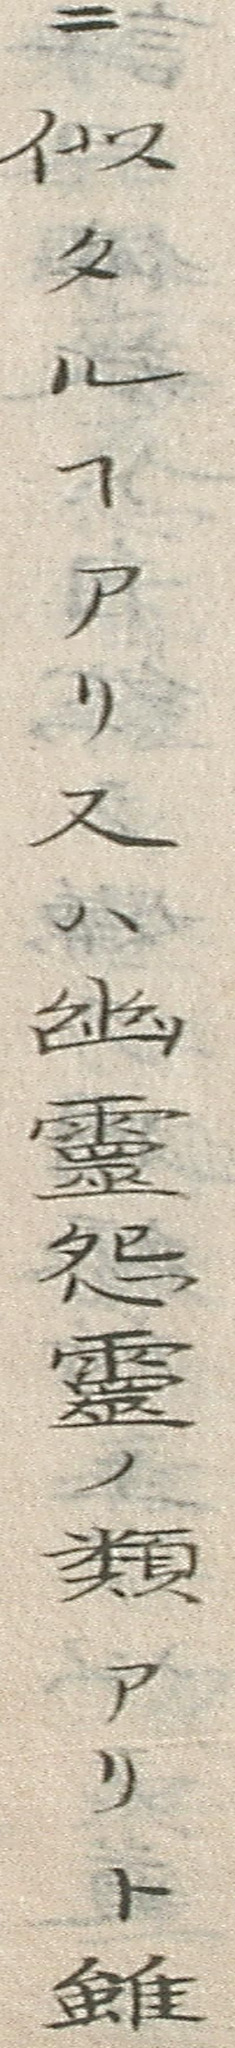ニ似タルコトアリ又ハ幽霊怨霊ノ類アリト雖
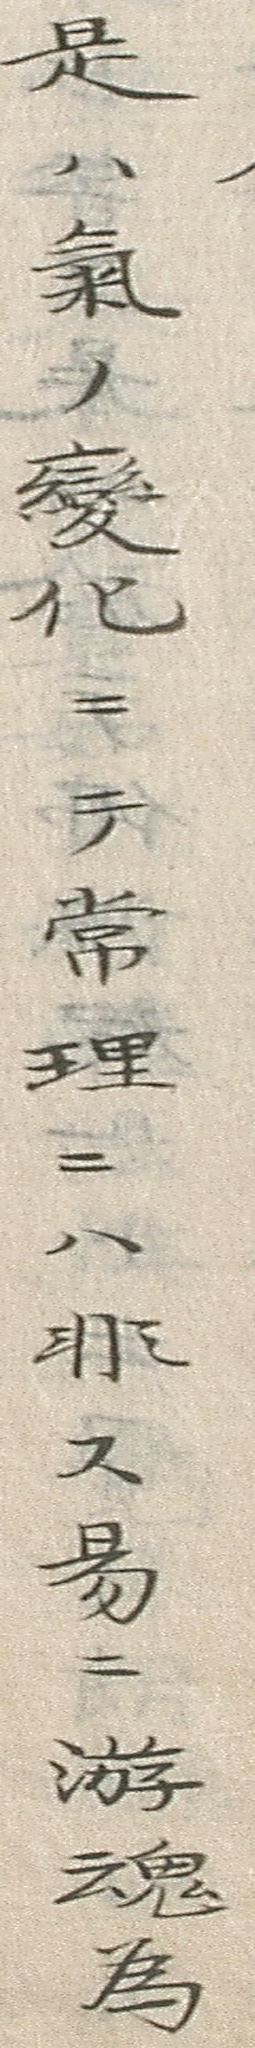是ハ気ノ変化ニテ常理ニハ非ス易ニ游魂為
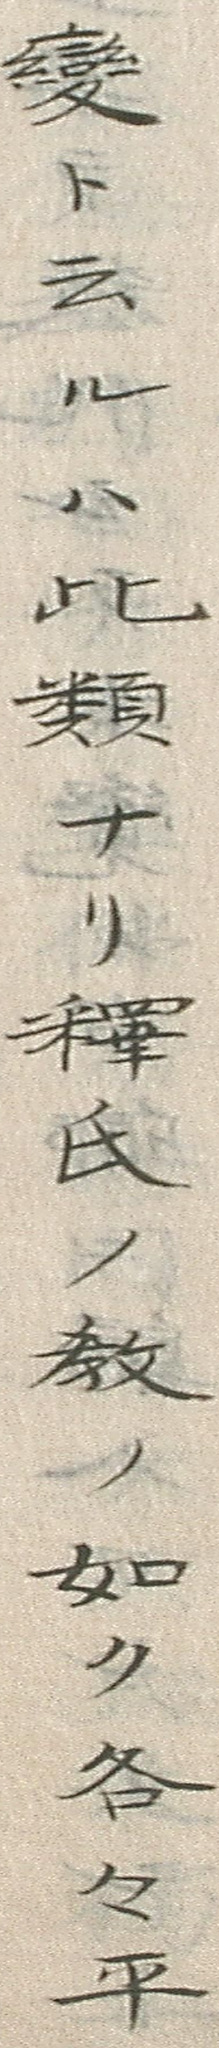変ト云ルハ此類ナリ釈氏ノ教ノ如ク各々平
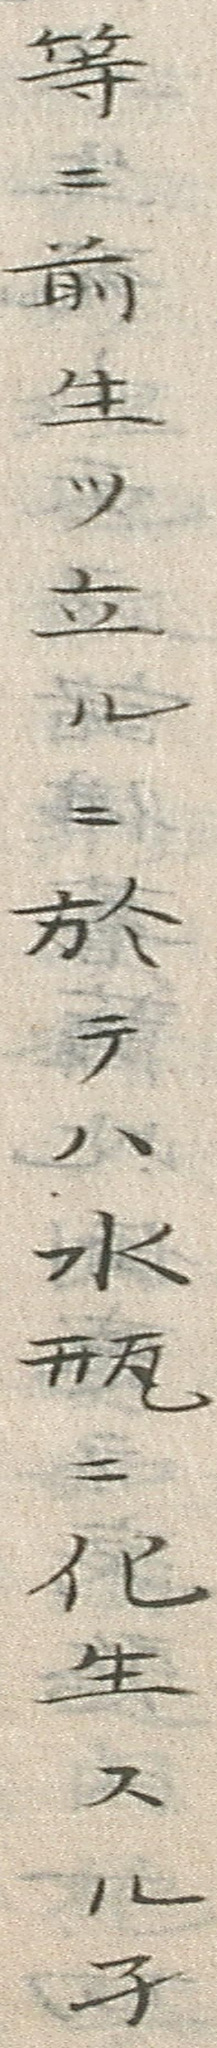等ニ前生ノ立ルニ於テハ水瓶ニ化生スル孑
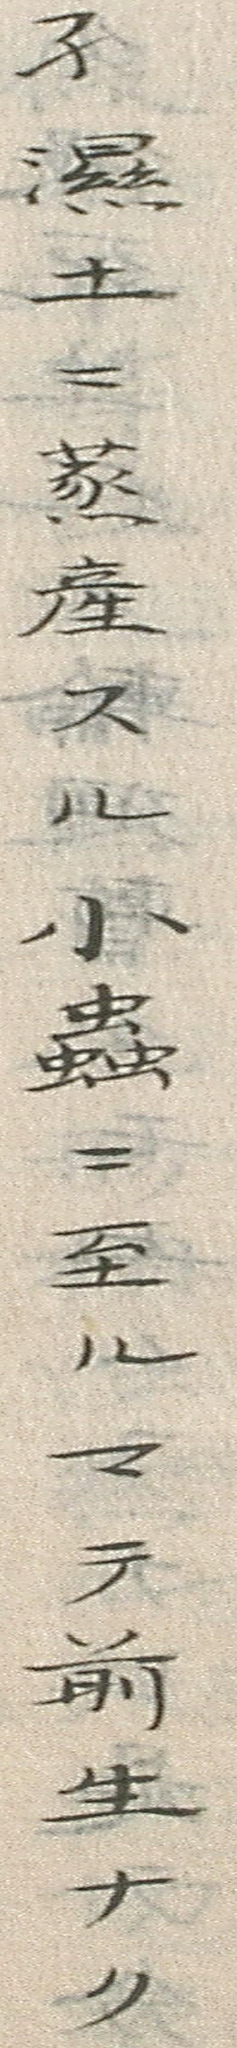孑湿土ニ蒸産スル小蟲ニ至ルマテ前生ナク
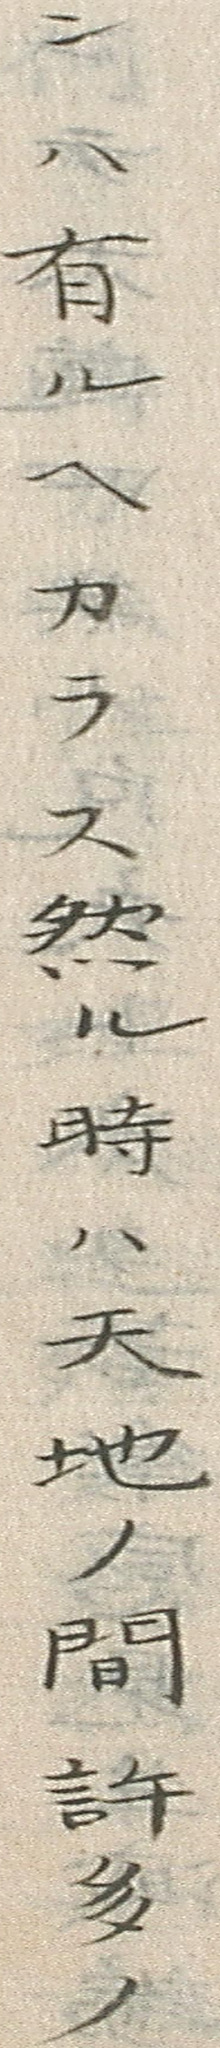ンハ有ルヘカラス然ル時ハ天地ノ間許多ノ
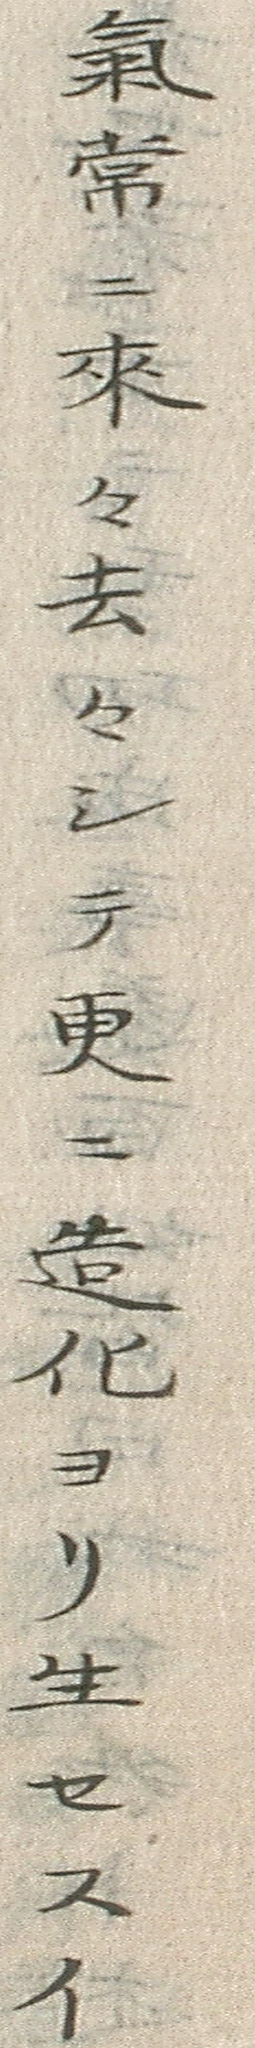気常ニ来々去々シテ更ニ造化ヨリ生セスイ
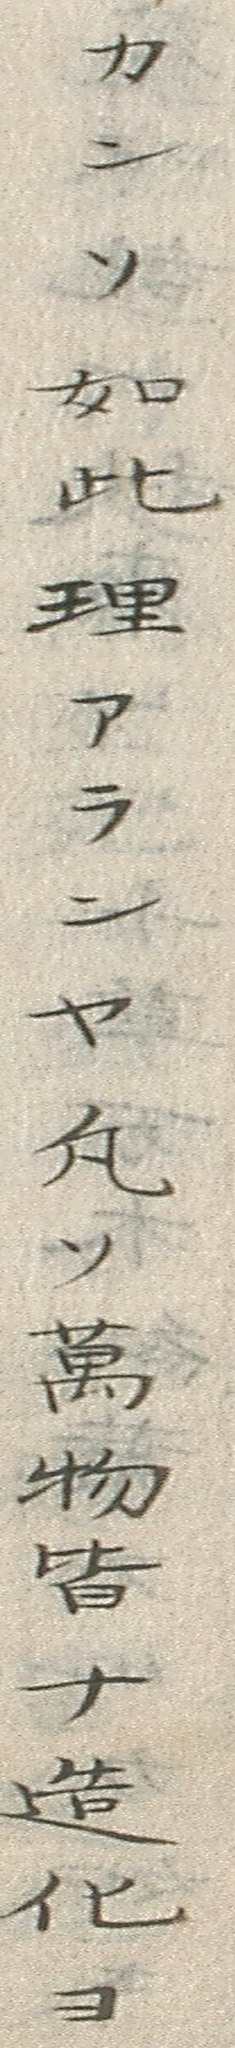カンソ如此理アランヤ凡ソ万物皆ナ造化ヨ
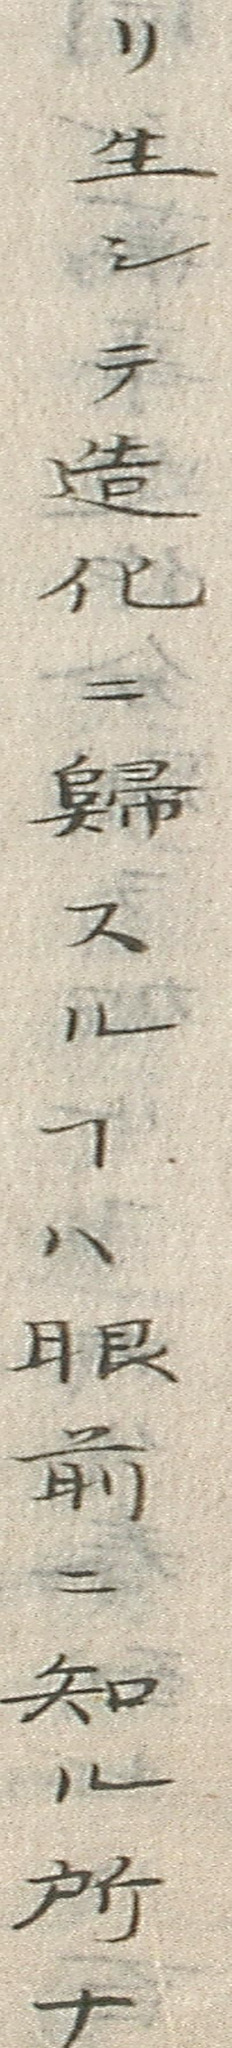リ生シテ造化ニ帰スルコトハ眼前ニ知ル所ナ
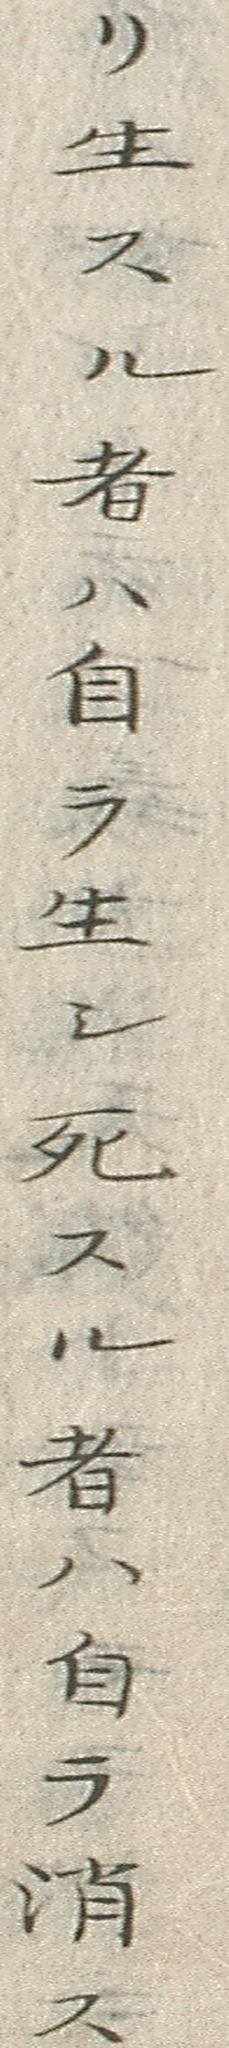リ生スル者ハ自ラ生シ死スル者ハ自ラ消ス
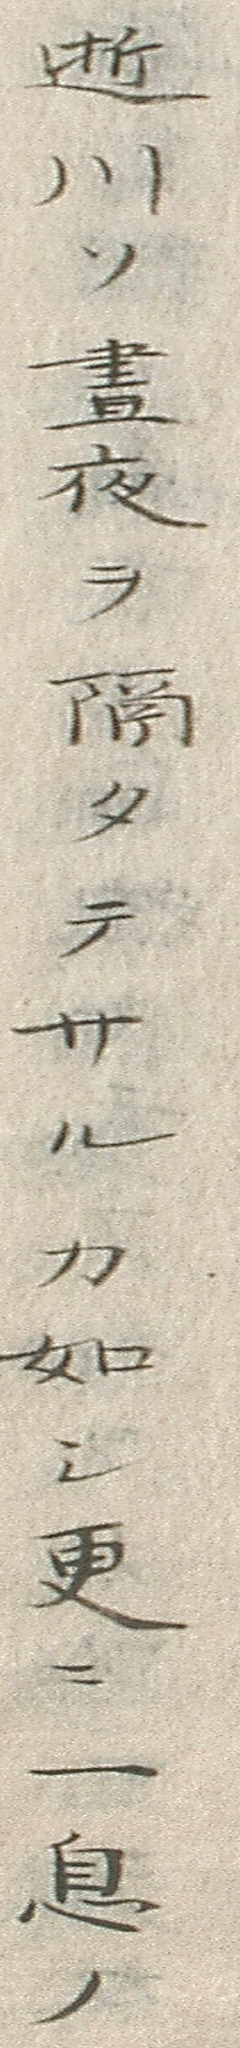逝川ソ昼夜ヲ隔タテサルカ如シ更ニ一息ノ
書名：天學略名目羽翼　全
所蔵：東京大学地震研究所図書室 Earthquake Research Institute Library, The University of Tokyo, JAPAN
